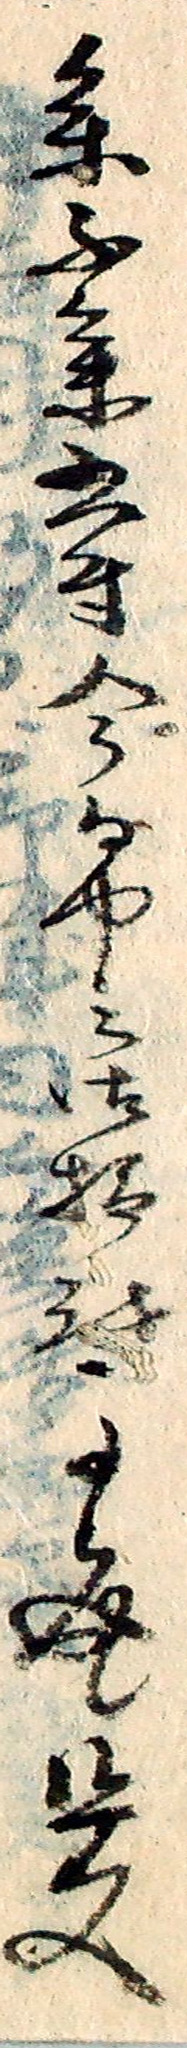参不参書付今日中に御指越可被成候且又
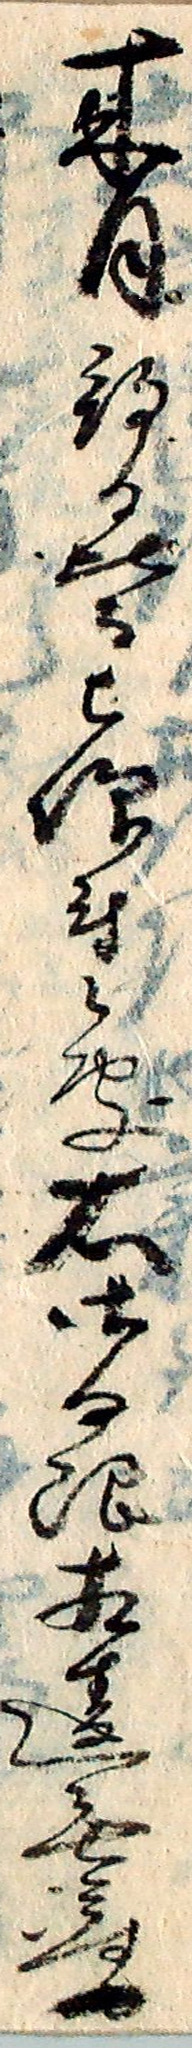来月朔日比と被仰付候処右御日限相違無御座
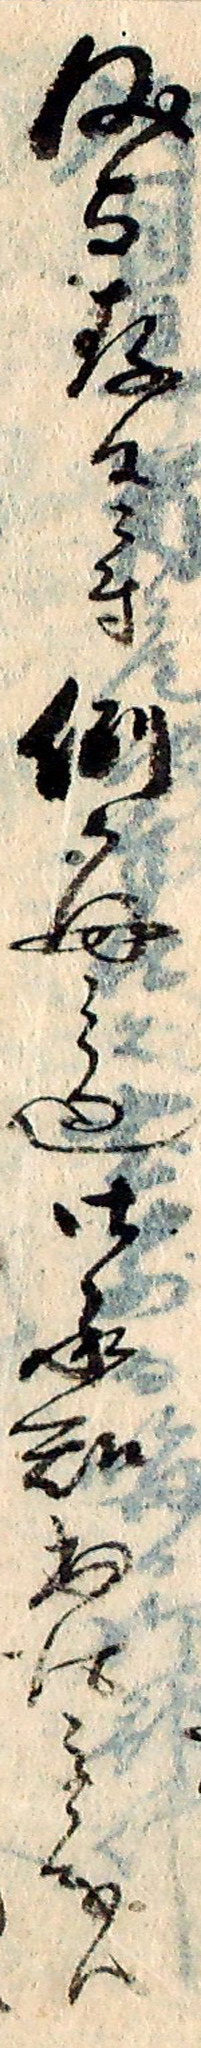儀と存候に付例毎之通御承知出仕之義は
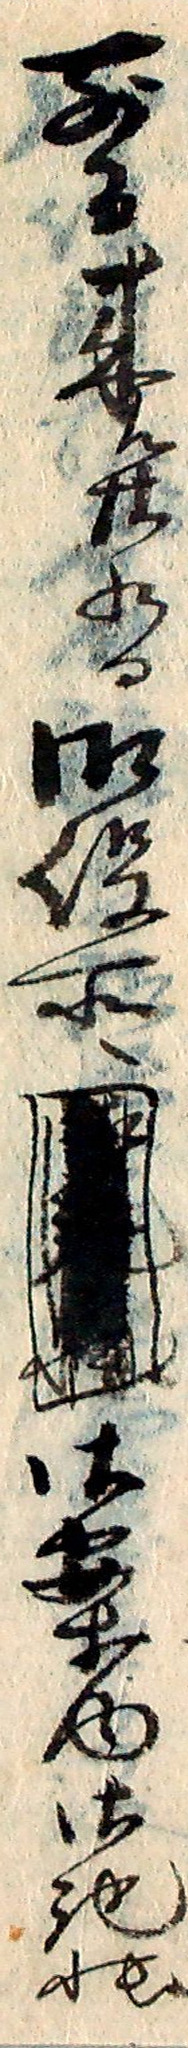別て来る廿九日御役所へ御案内御記帳
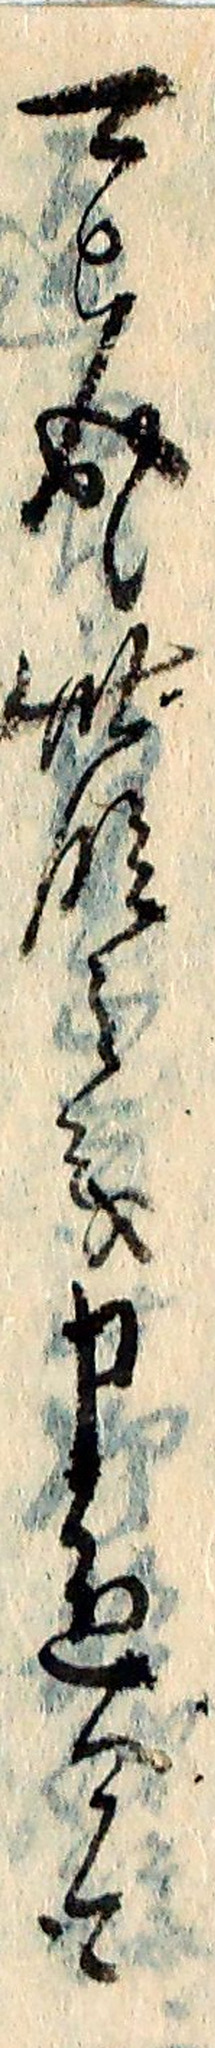可被成候此段之義申進候以上
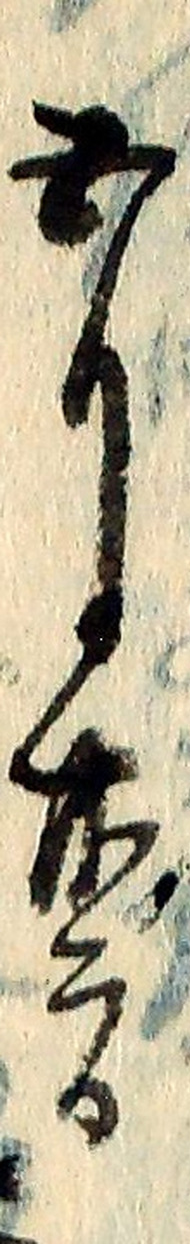五月廿二日
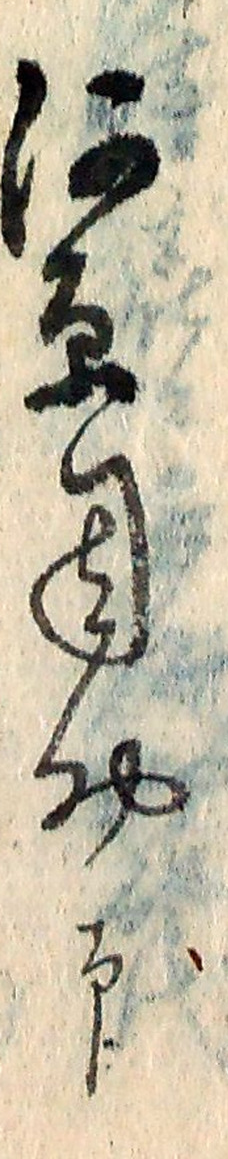河原周助印
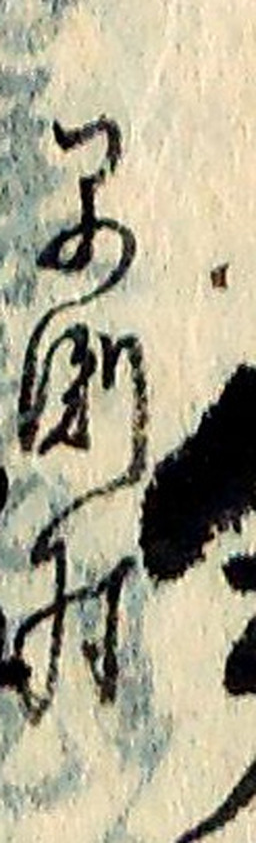早淵村
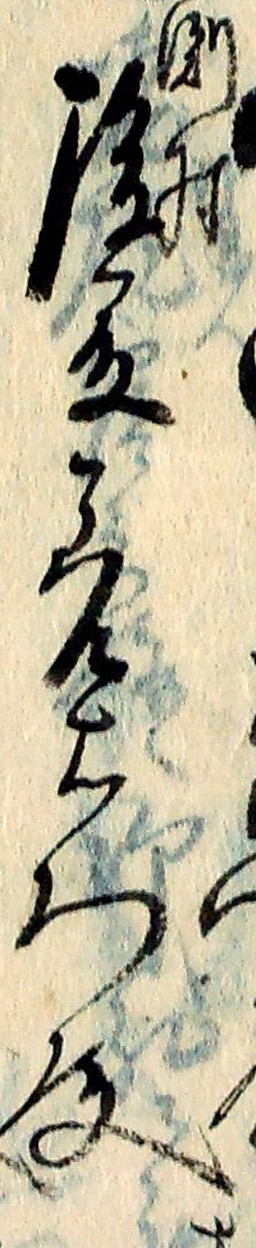後藤善右衛門殿
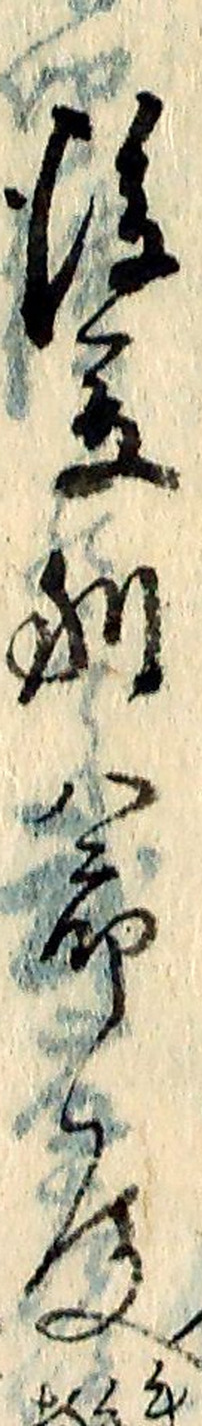後藤利八郎実印
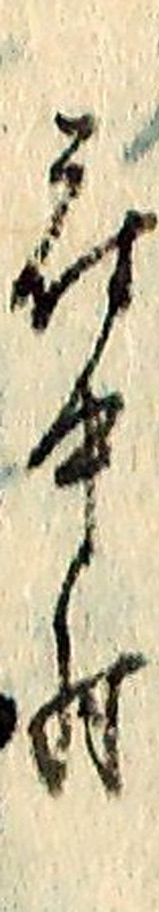府中村
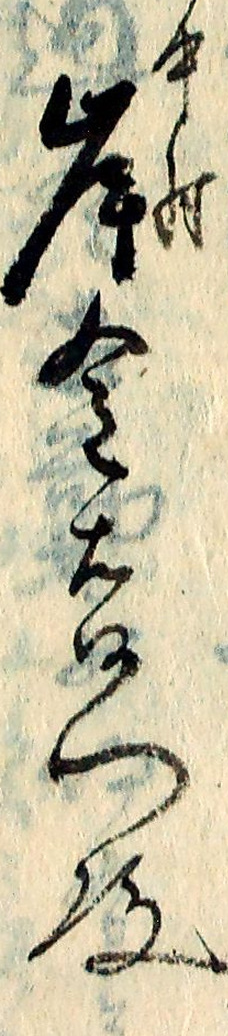岸金右衛門殿
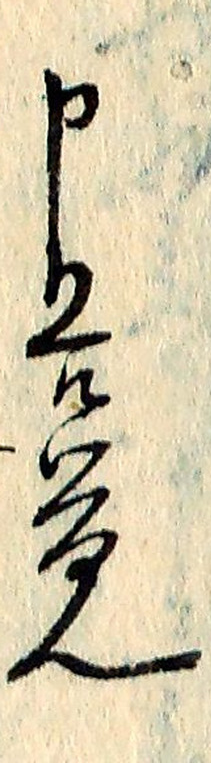申上る覚
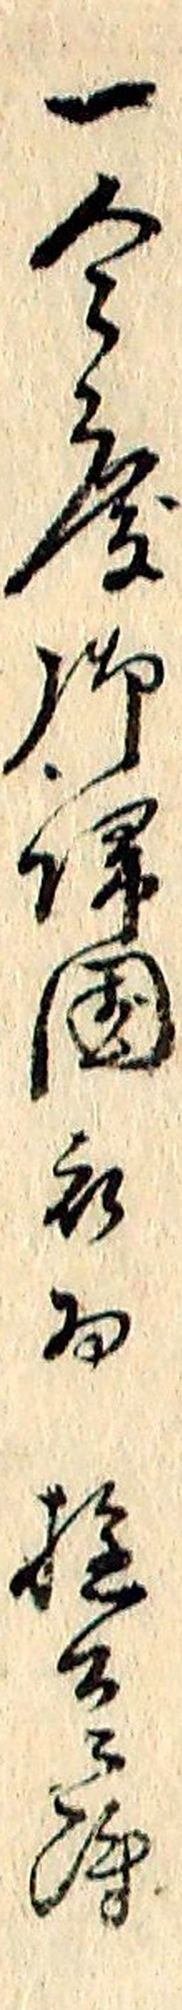一今度御帰国被為遊候に付
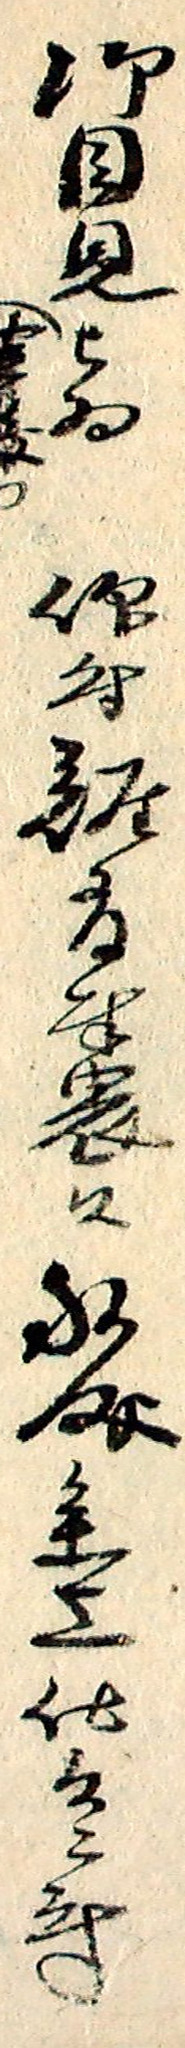御目見被為仰付難有奉畏候私儀参上仕候に付
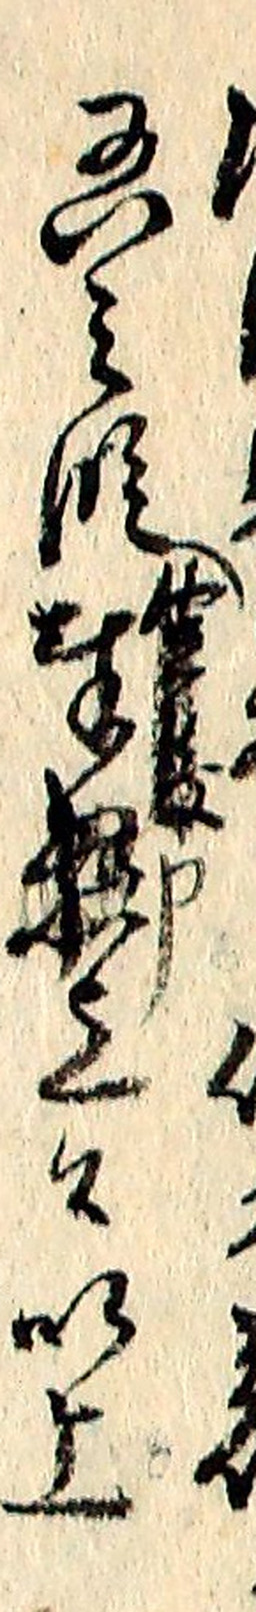右之段奉申上候以上
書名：諸御願書控(後藤氏壱番）
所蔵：鳴門教育大学 Naruto University of Education
